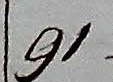91
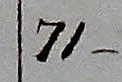71
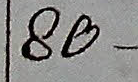80
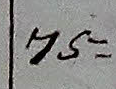75
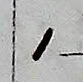1
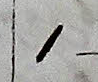1
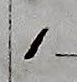1
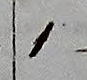1
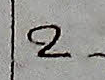2
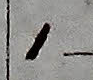1
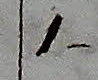1
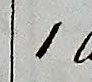1
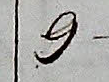9
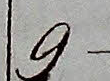9
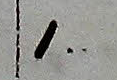1
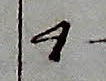4
